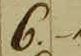6.
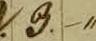3.
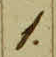1.
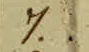7.
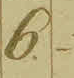6.
